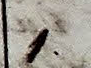1.
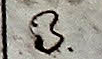3.
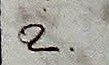2.
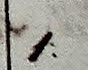1.
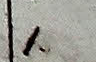1.
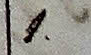1.
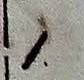1.
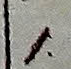1
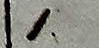1.
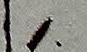1.
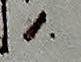1.
